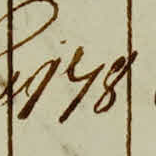178
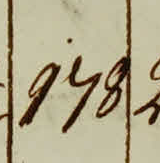178
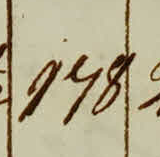178
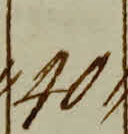40
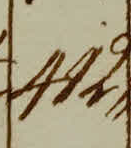412
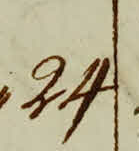24
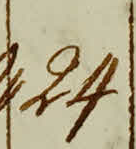24
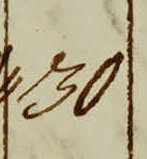30
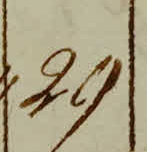29
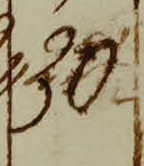30
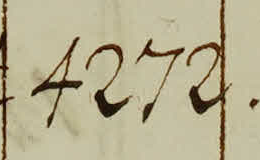4272
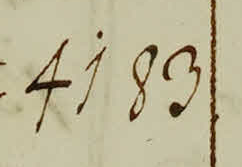4183
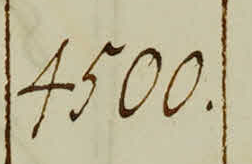45.00
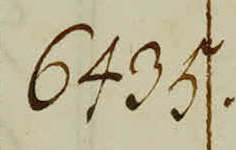6435
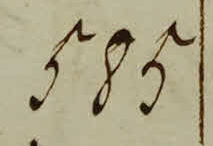585
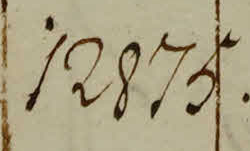12875
